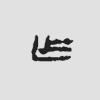乍
